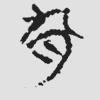九月
